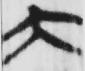大
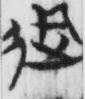○（卜）
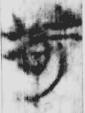苛
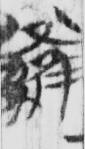羅
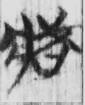戕
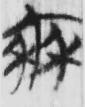秦
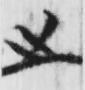之
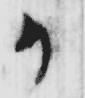人
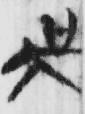吳
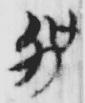加
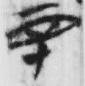辛
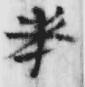未
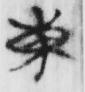東
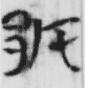○（厇）
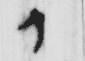人
